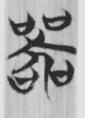器
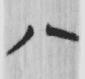八
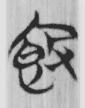{寶㿝殳}
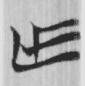乍
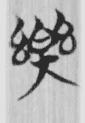樂
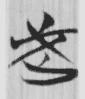武
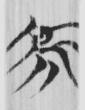象
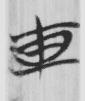車
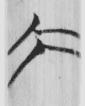大
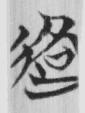{辶各}
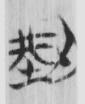型
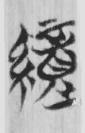{糸童}
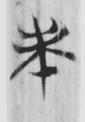未
